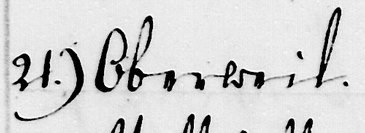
21.) Oberweil
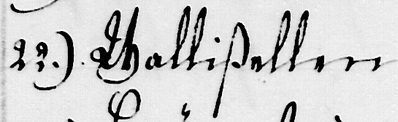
22.) Wallißellen
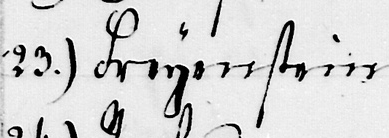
23.) Freyenstein
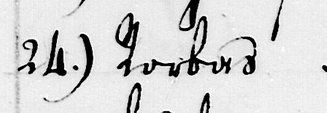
24.) Rorbas
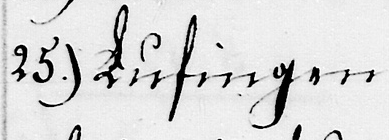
25.) Lufingen
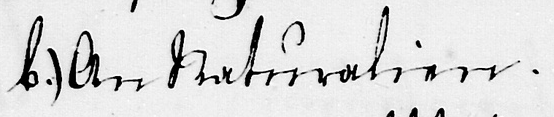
b.) An Naturalien
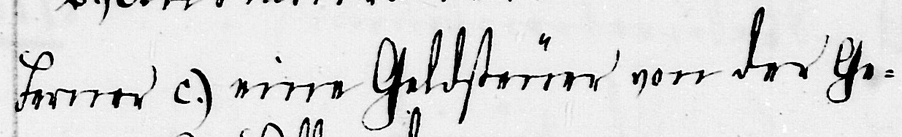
Ferner c.) eine Geldsteuer von der Ge¬
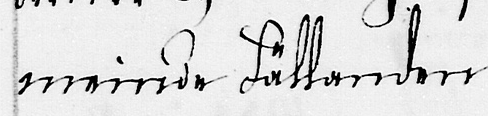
meinde Fällanden
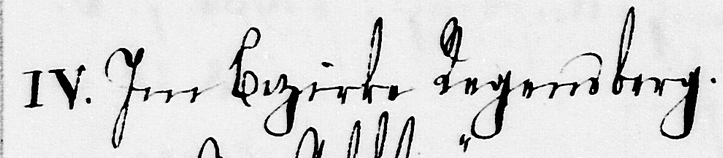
IV. Im Bezirke Regensberg.
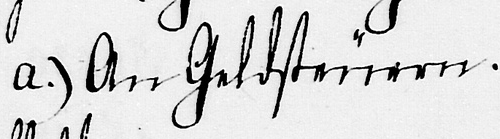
a.) An Geldsteuern.
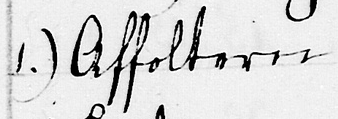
1.) Affoltern
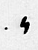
–.
